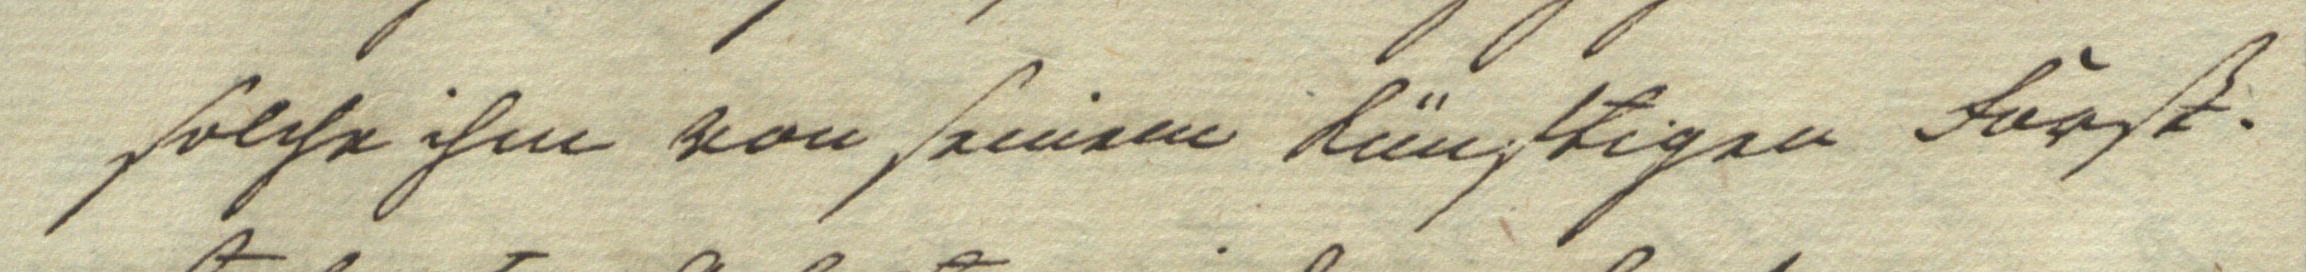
solche ihm von seinem künftigen Forst¬
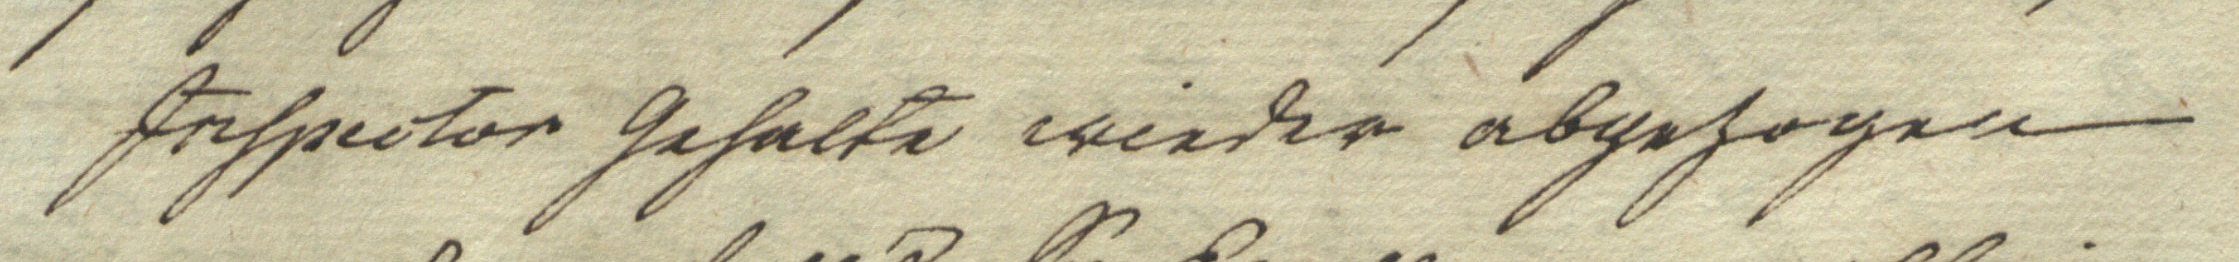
Inspector Gehalte wieder abgezogen
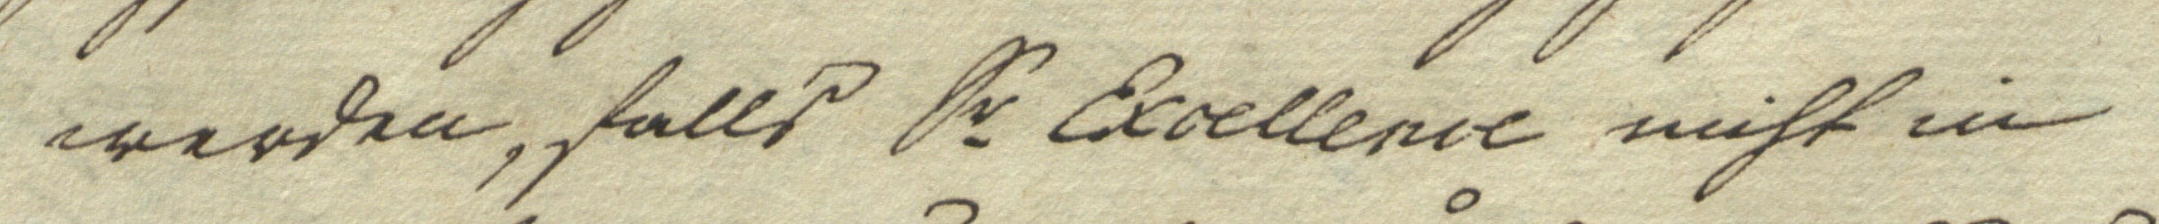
werden, falls Sr Excellence nicht in
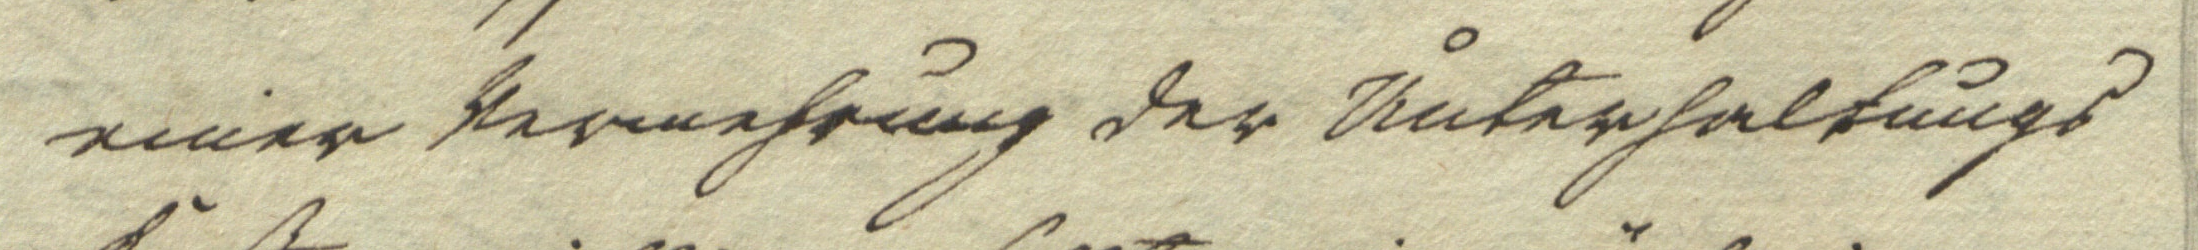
einer Vermehrung der Unterhaltungs
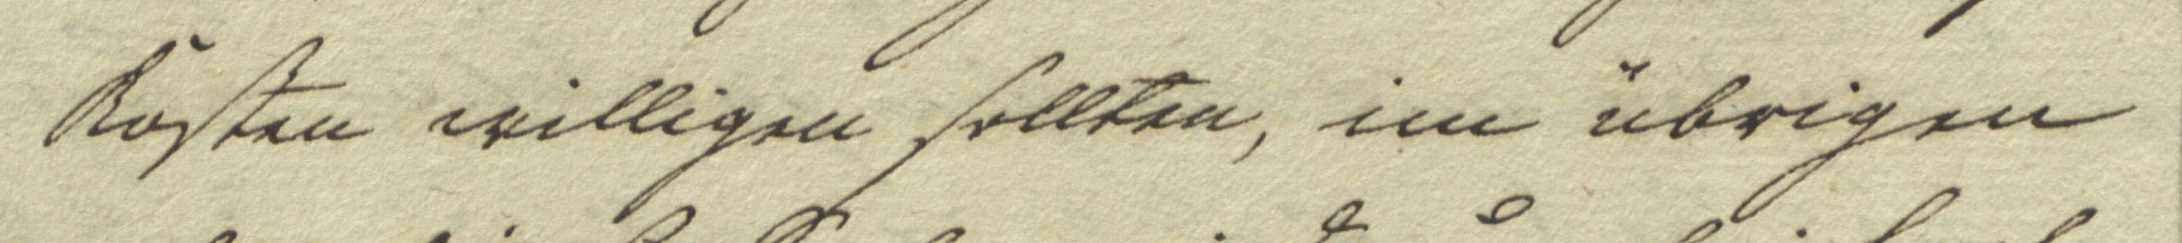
Kosten willigen sollten, im übrigen
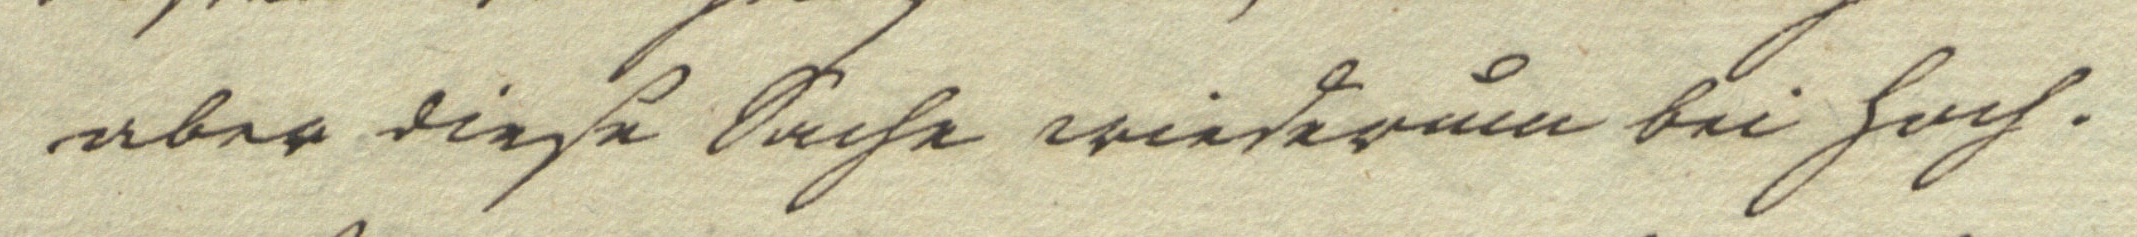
aber diese Sache wiederum bei Hoch-
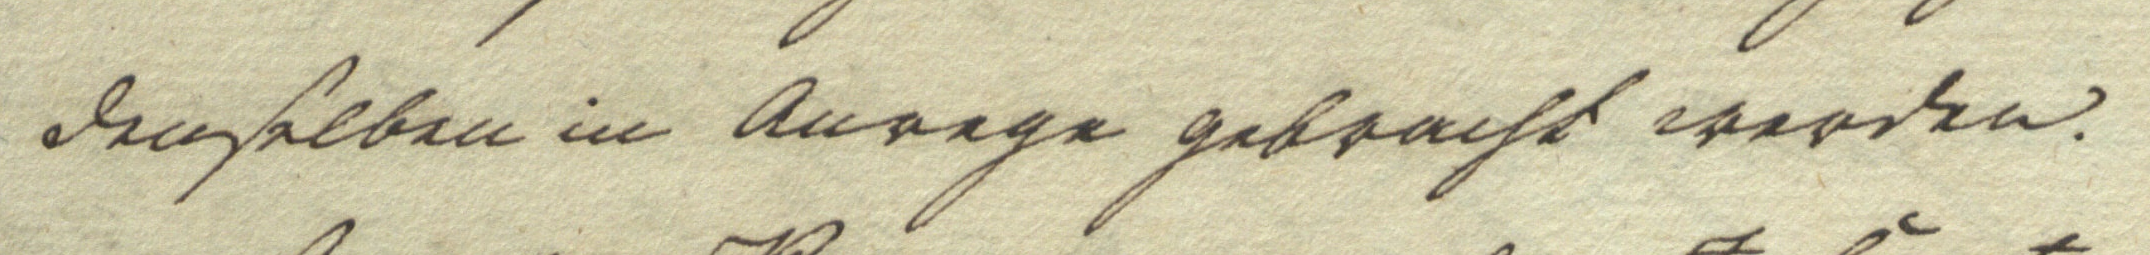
denselben in Anrege gebracht werden.
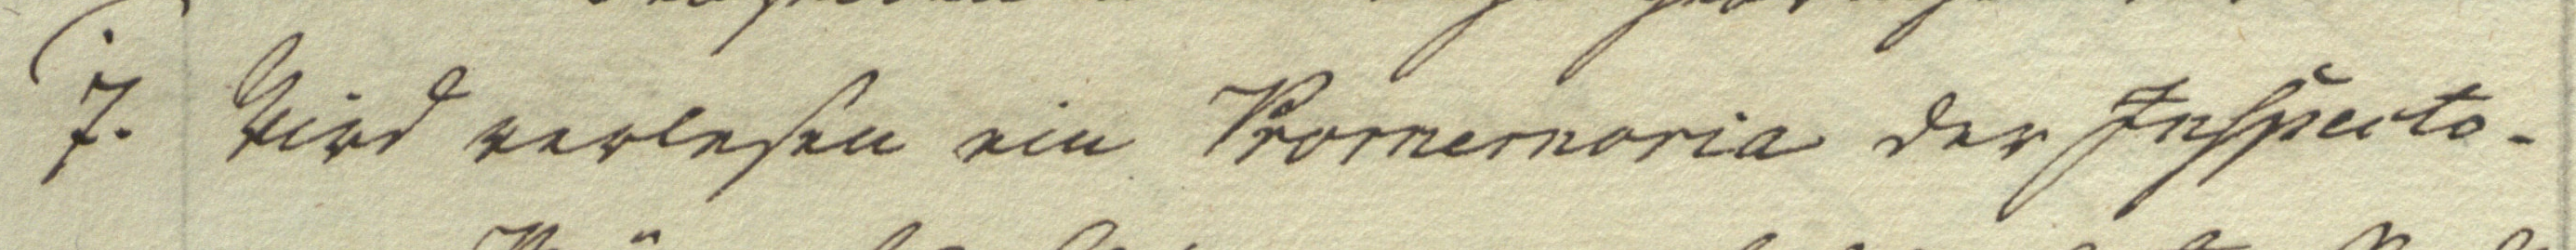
7. Wird verlesen ein Promemoria der Inspecto¬
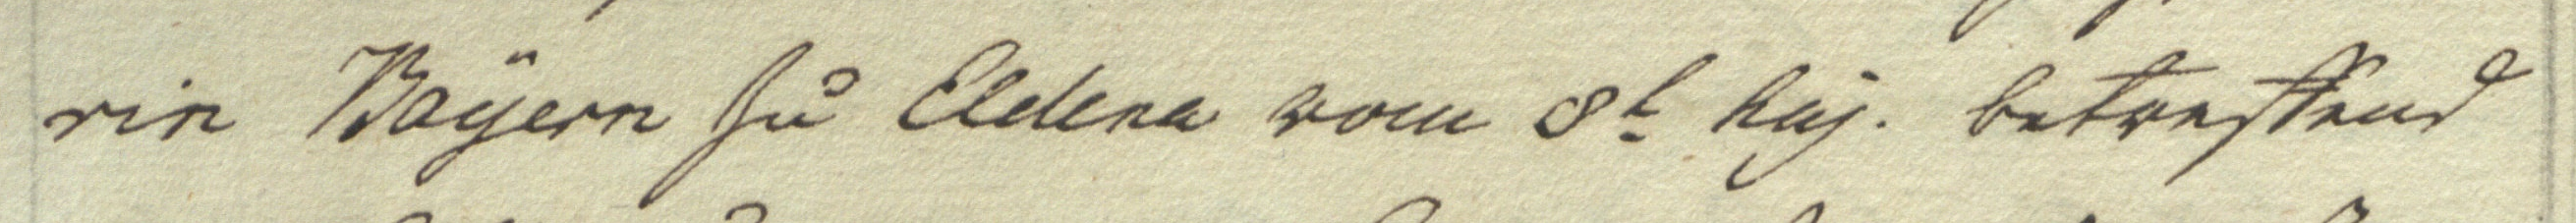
rin Baÿern zu Eldena vom 8 t huj. betreffend
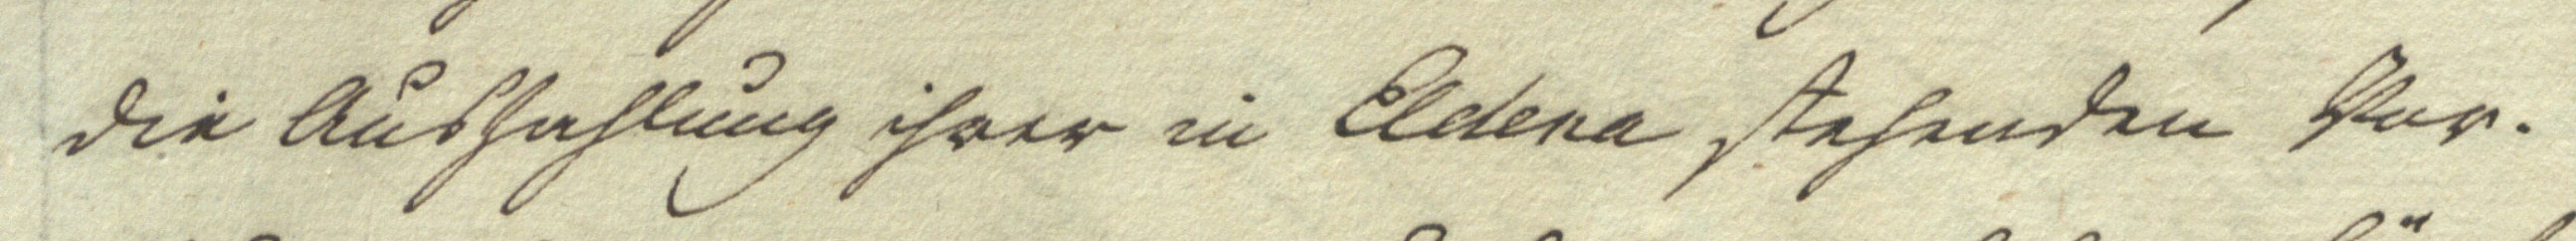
die Auszahlung ihrer in Eldena stehenden Vor¬
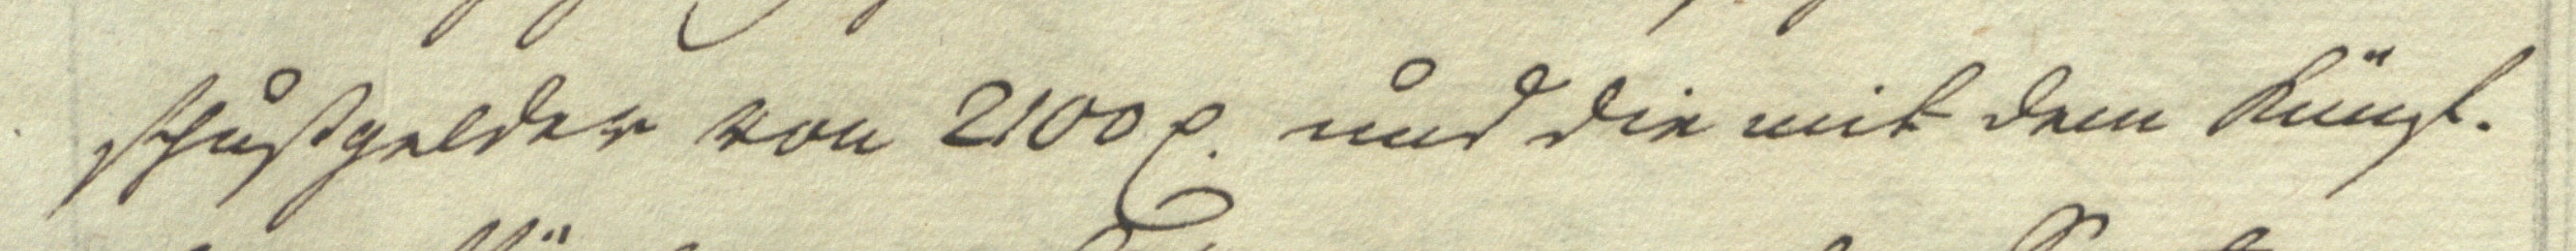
schußsgelder von 2100 l. und die mit dem künf¬
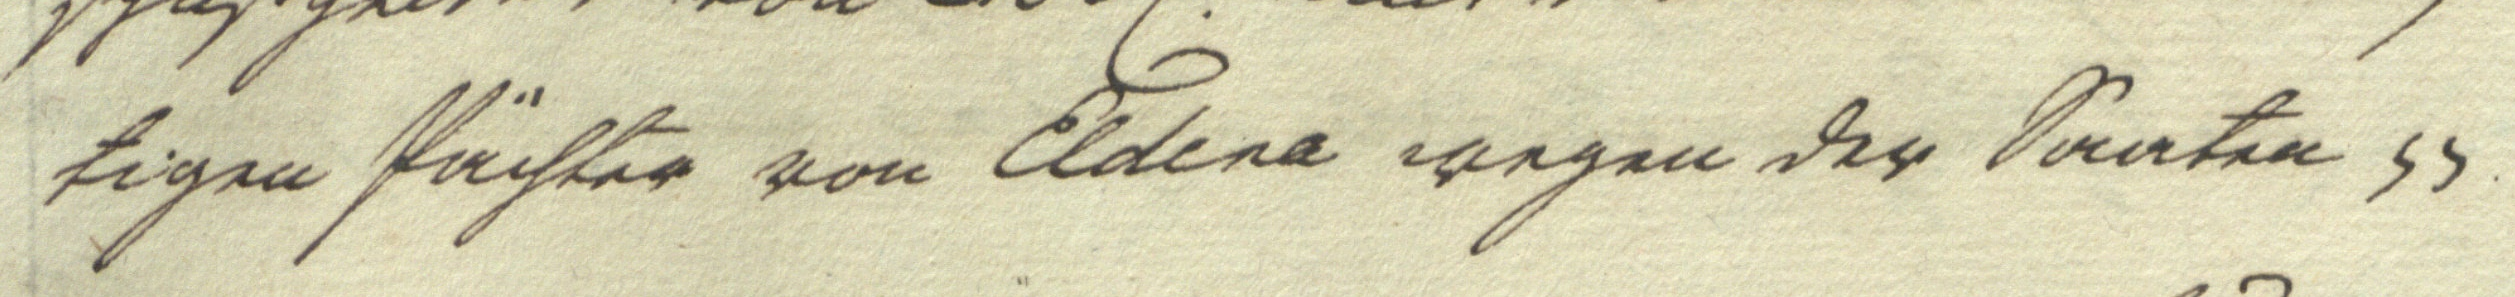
tigen Pächter von Eldena wegen der Saaten
